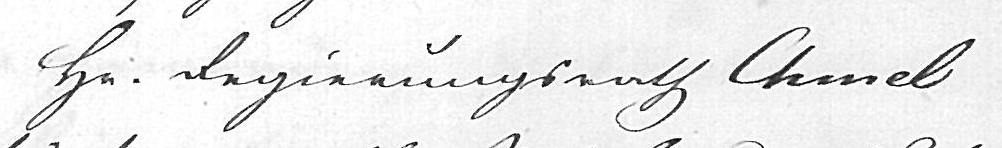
Hr. Regierungsrath Chmel
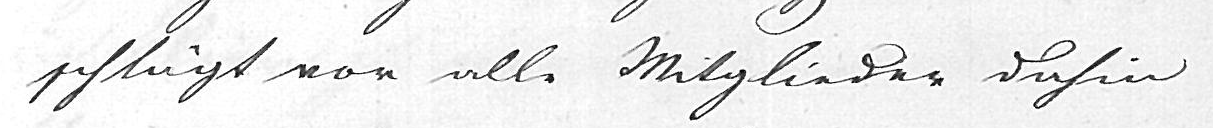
schlägt vor alle Mitglieder dahin
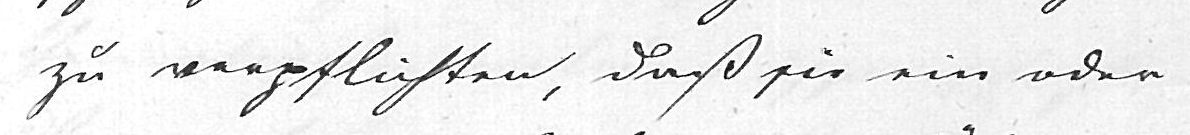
zu verpflichten, daß sie ein oder
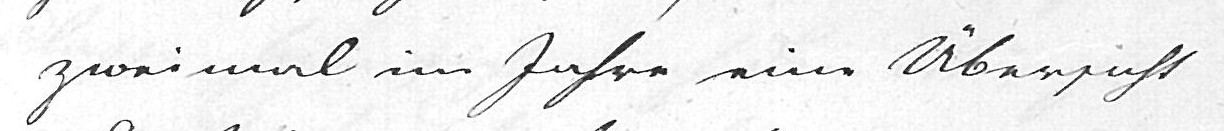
zweimal im Jahre eine Übersicht
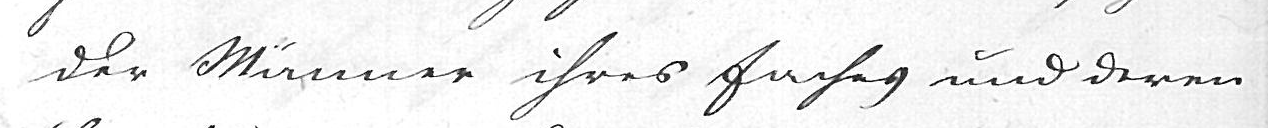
der Männer ihres Faches und deren
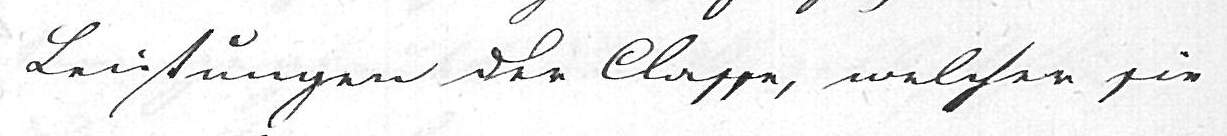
Leistungen der Classe, welcher sie
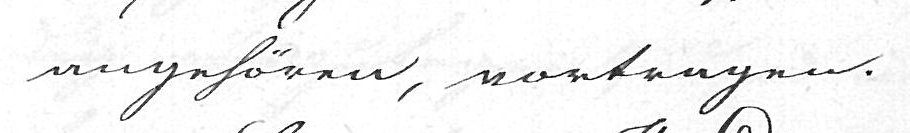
angehören, vortragen.
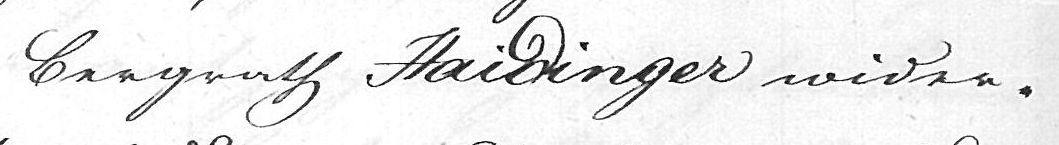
Bergrath Haidinger wider-
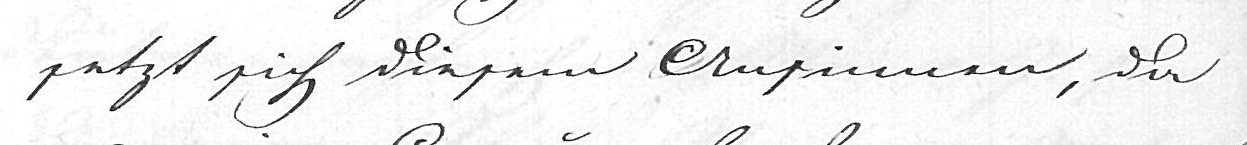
setzt sich diesem Ansinnen, da
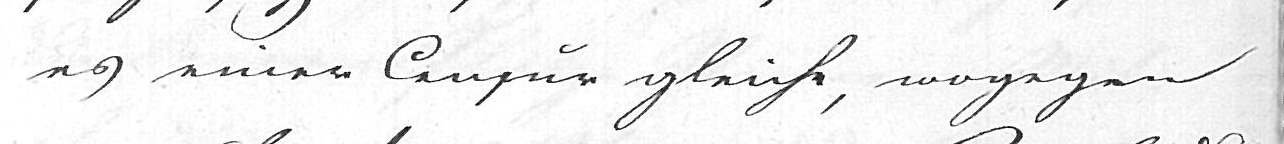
es einer Censur gleiche, wogegen
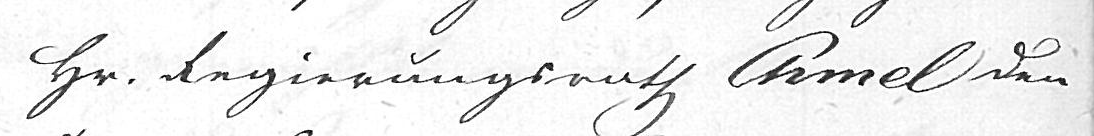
Hr. Regierungsrath Chmel den
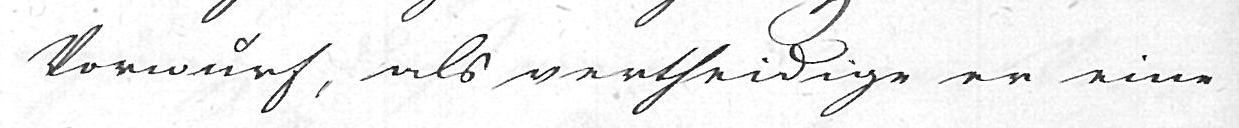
Vorwurf, als vertheidige er eine
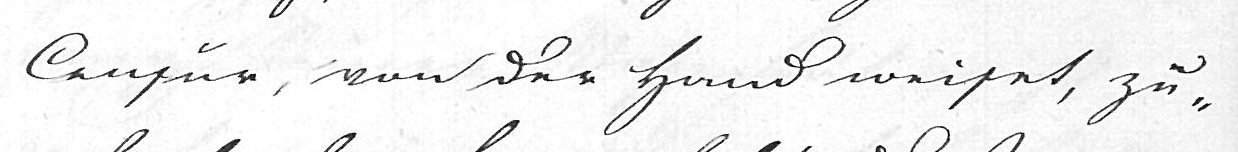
Censur, von der Hand weiset, zu-
